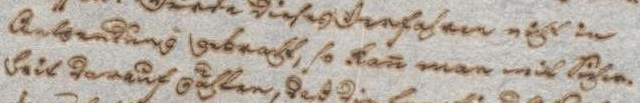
Anwendung gebracht, so kann man mit Sicher-
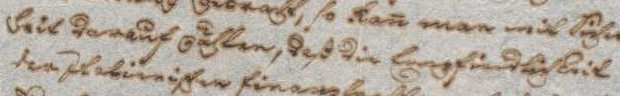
heit darauf zählen, daß die Empfindlichkeit
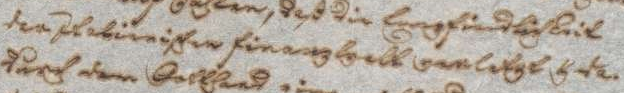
der Italienischen Finanzwelt verletzt & da-
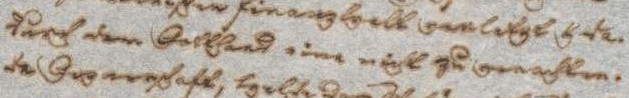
durch dem Gotthard eine nicht zu verachten-
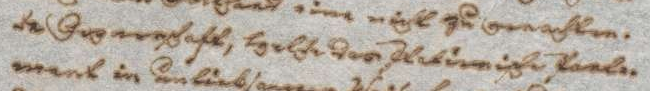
de Gegnerschaft, welche das Italienische Parla-
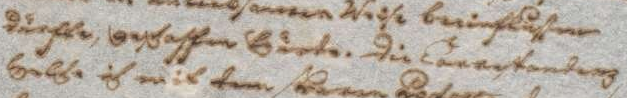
dürfte, geschaffen würdde. Die Correspondenz,
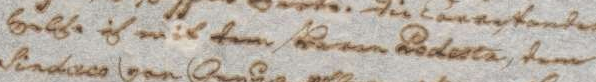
welche ich mit dem Baron Podesta, dem
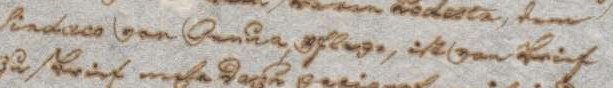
Sindaco von Genua, pflege, ist von Brief
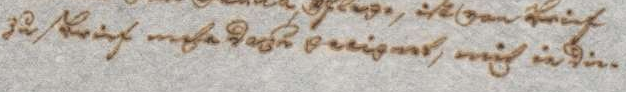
zu Brief mehr dazu geeignet, mich in die-
